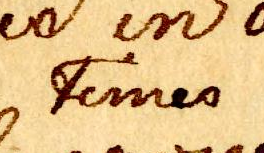Times
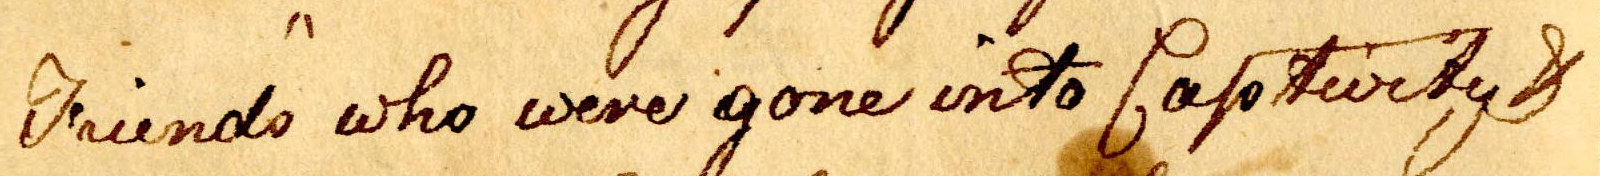Friends who were gone into Captivity &
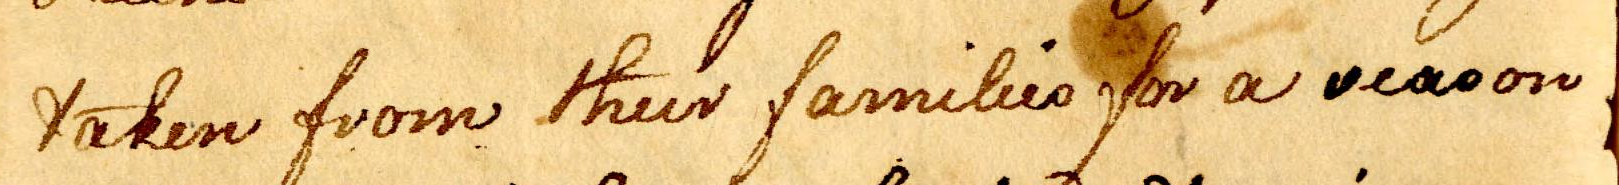taken from their families for a season
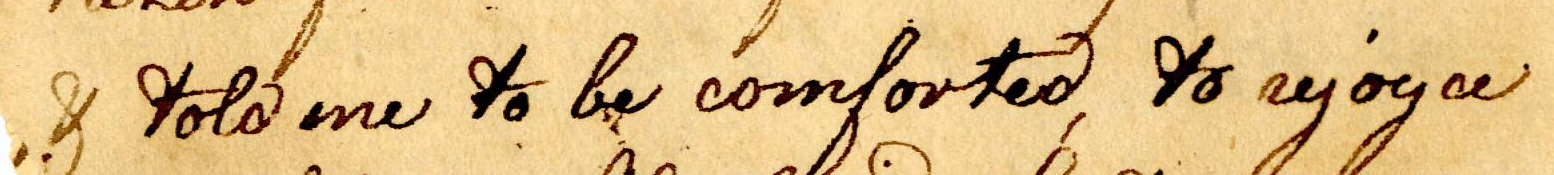& told me to be comforted, to rejoyce
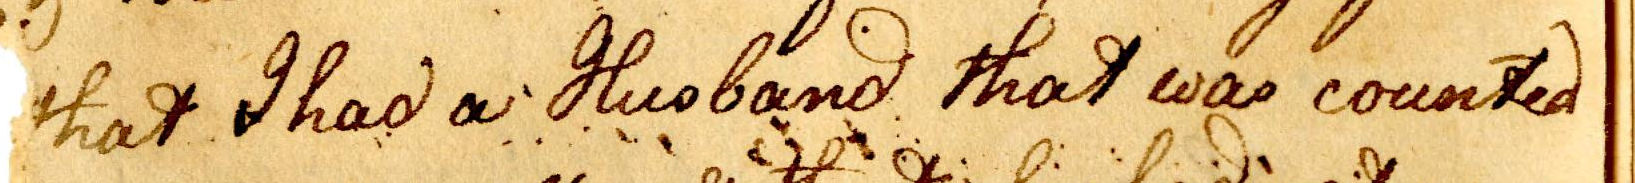that I had a Husband that was counted
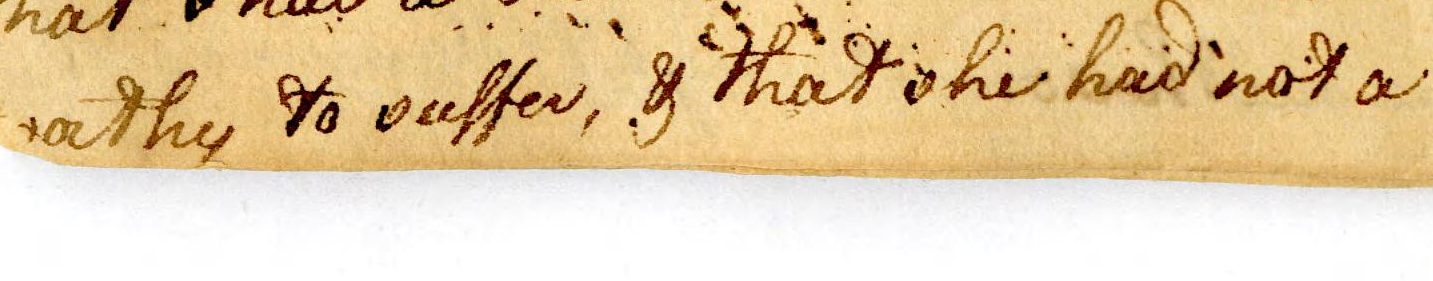worthy to suffer, & that she had not a
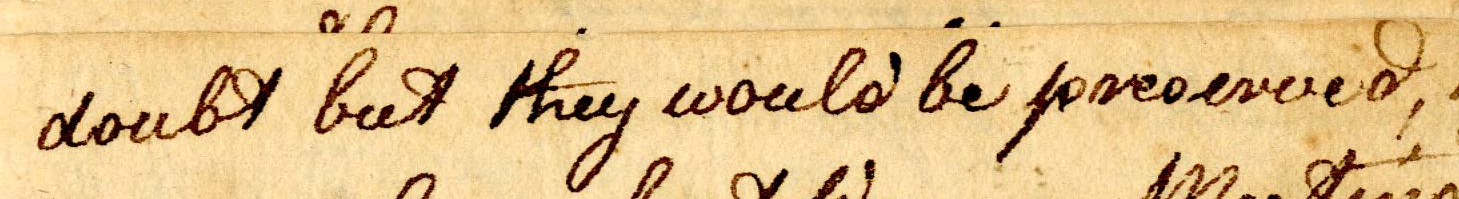doubt but they would be preserved
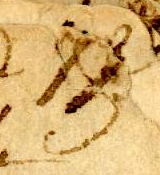11
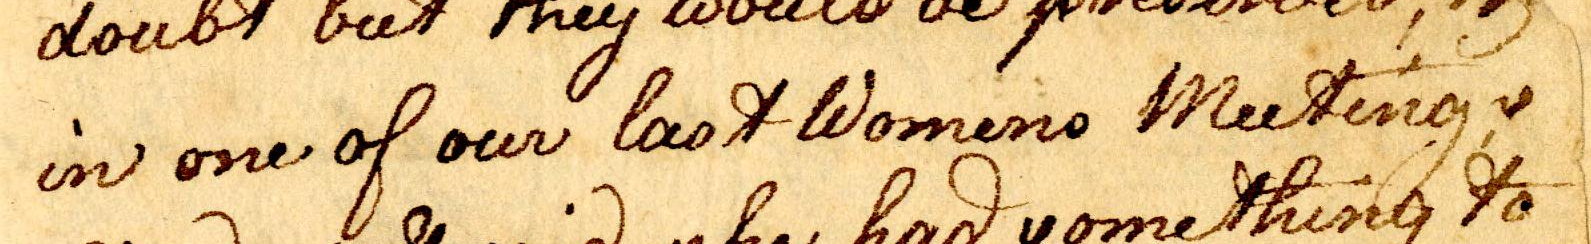in one of our last Womens Meetings
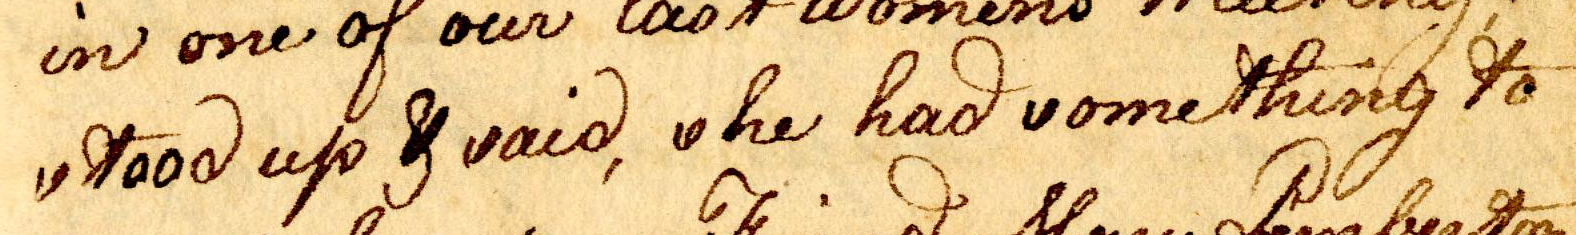stood up & said, she had something to
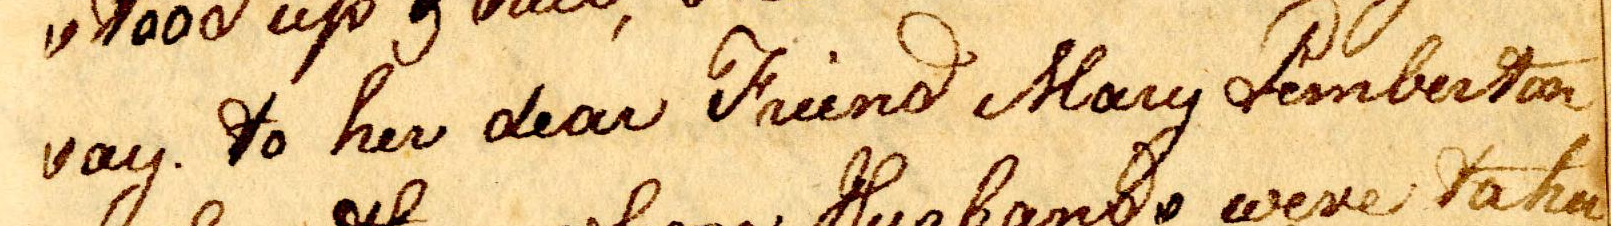say to her dear Friend Mary Pemberton
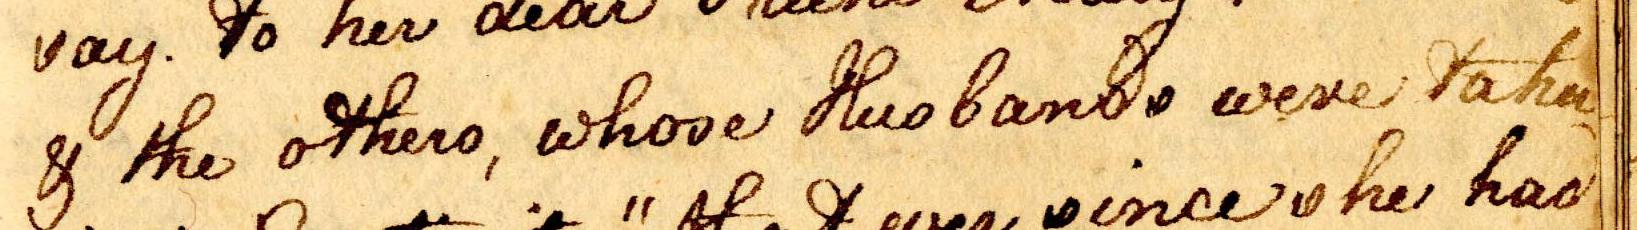& the others, whose Husbands were taken
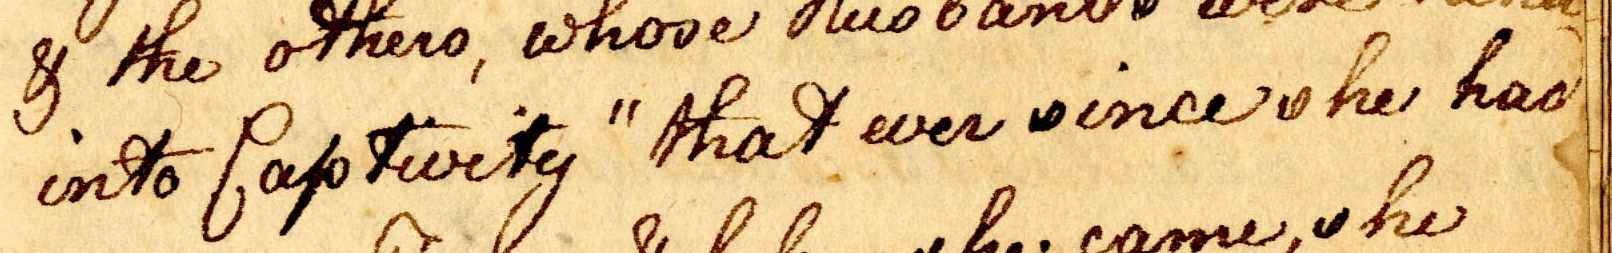into Captivity "that ever since she has
